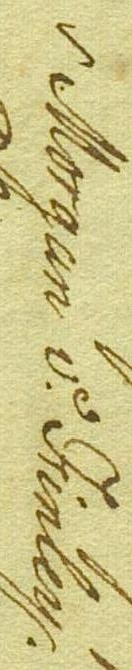- Morgan v^d. Finley.
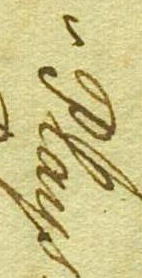- Plays
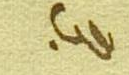3.
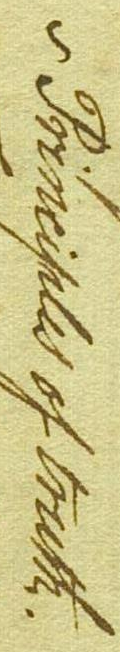- Principles of truth.
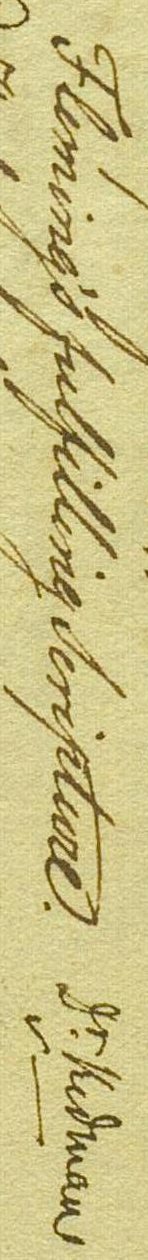Fleming's fulfilling Scripture. D^r. Kidman
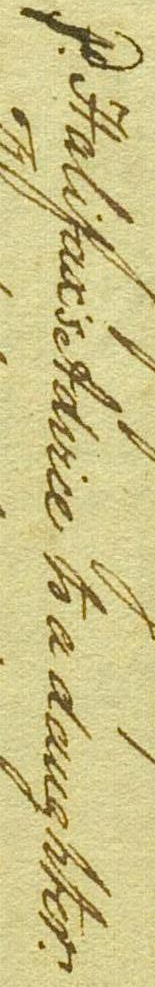[__] Halifax's Advice to a daughter.
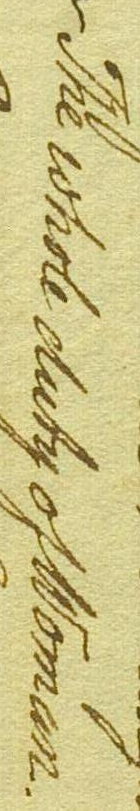- The whole duty of Woman.
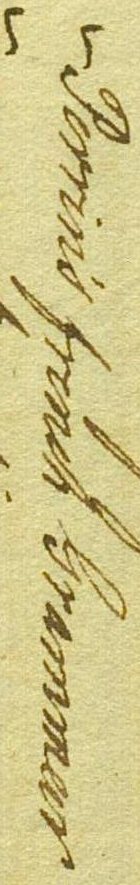- Perrin's french Grammar
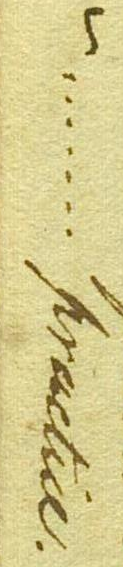- ....... practice.
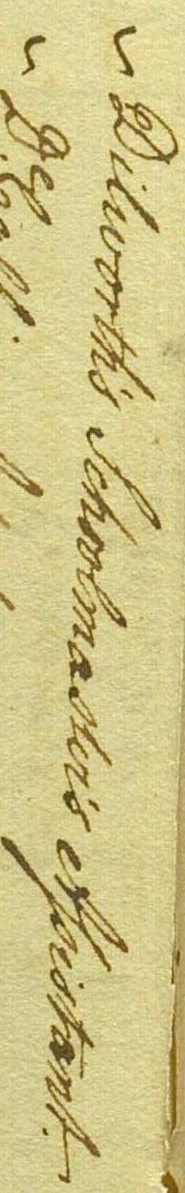- Dilworth's Schoolmaster's Assistant.
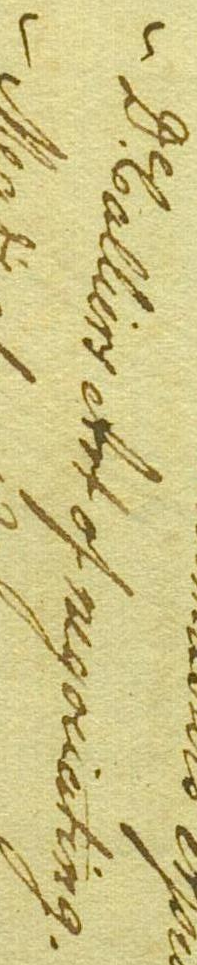- D^r Colliers Art of negociating.
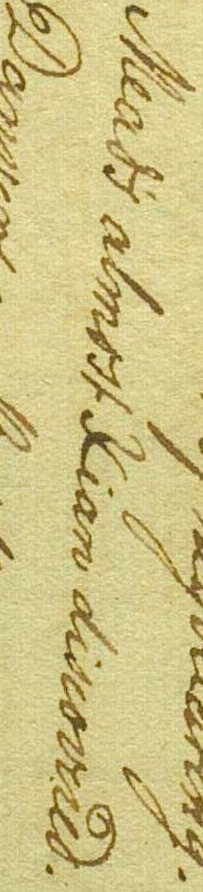- Mead's almost Xian discovered.
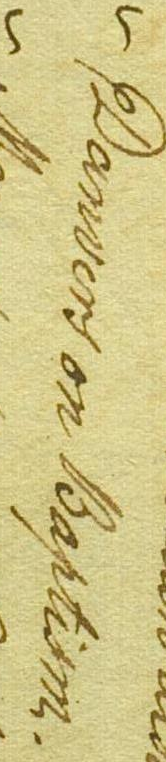- Danvers on Baptism.
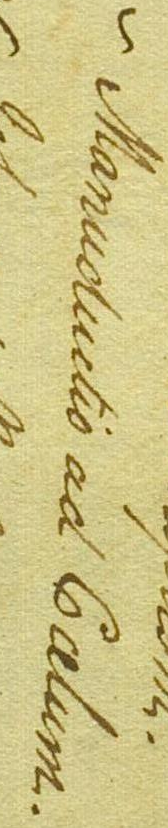- Manuductis ad Calum.
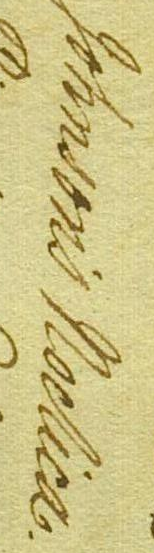- Johnson's Noelica
